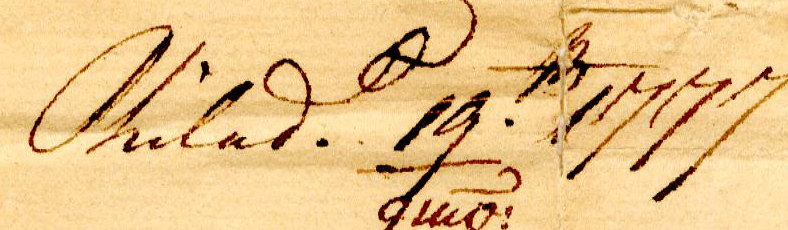Philad.^a 19.^th 1777
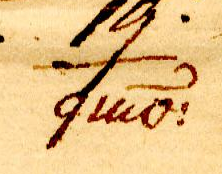9 mo:
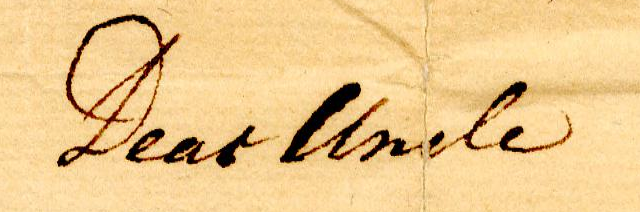Dear Uncle
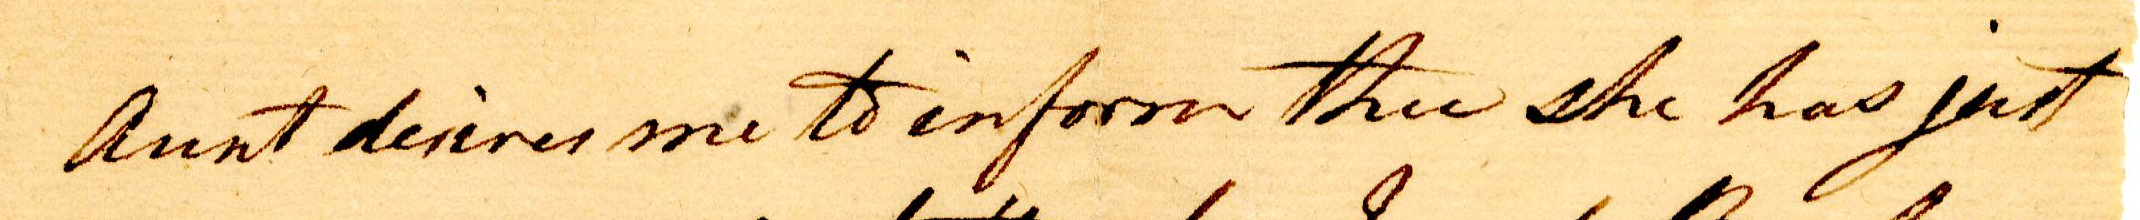Aunt desires me to inform thee she has just
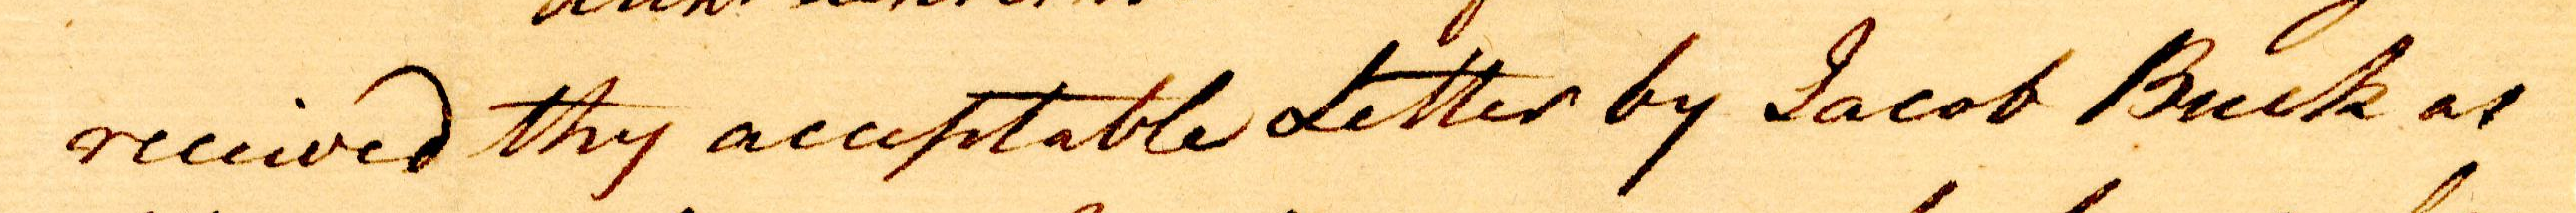received thy acceptable Letter by Jacob Buck as
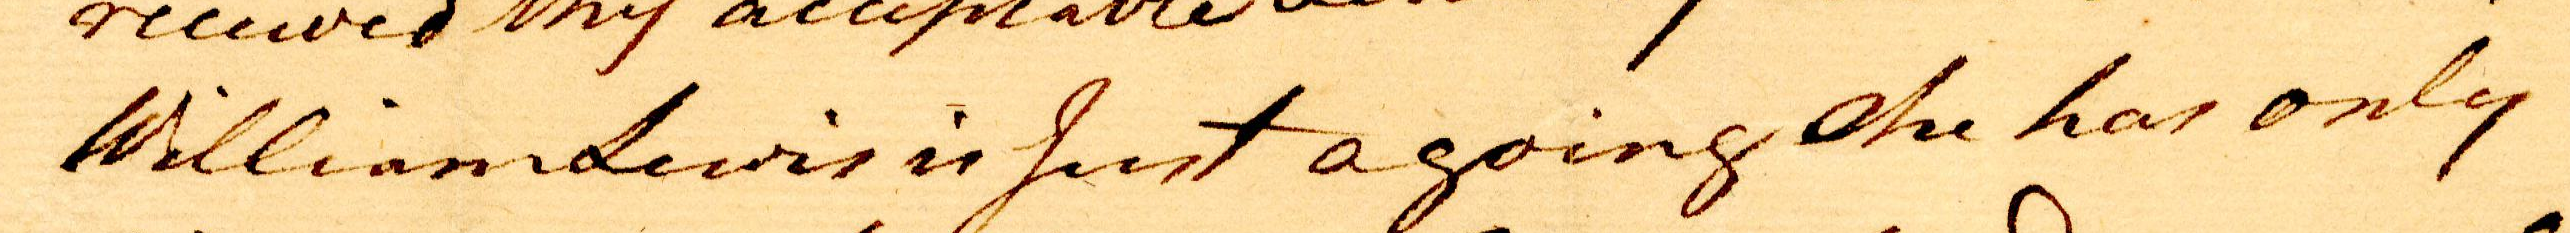William Lewis is Just a going she has only
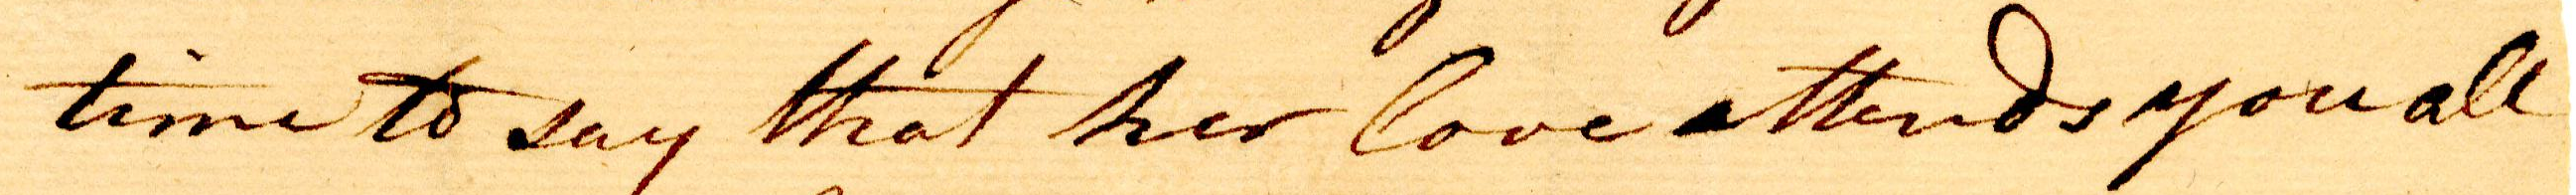time to say that her love attends you all
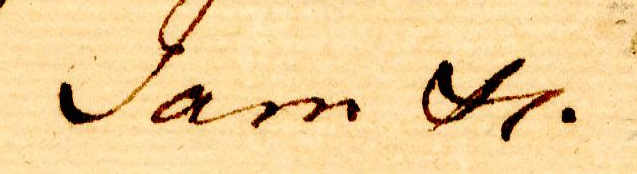I am &c.
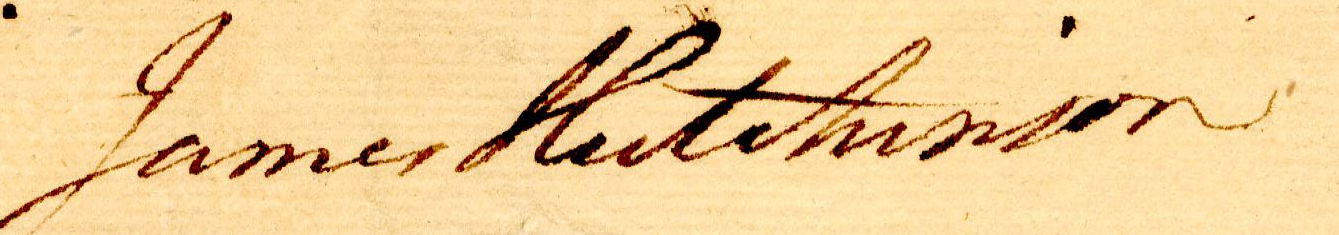James Hutchinson
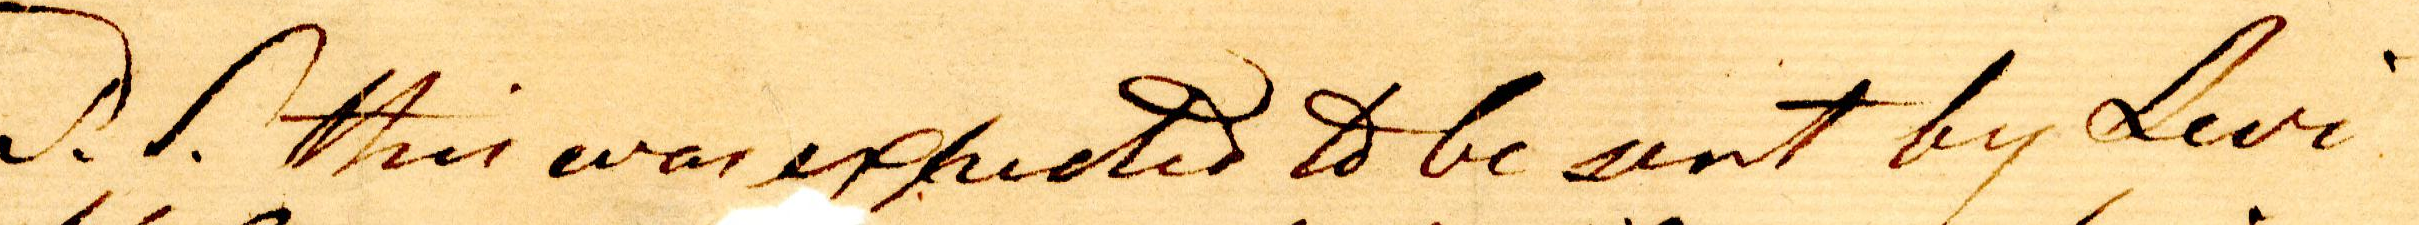P.S. this was expected to be sent by Levi
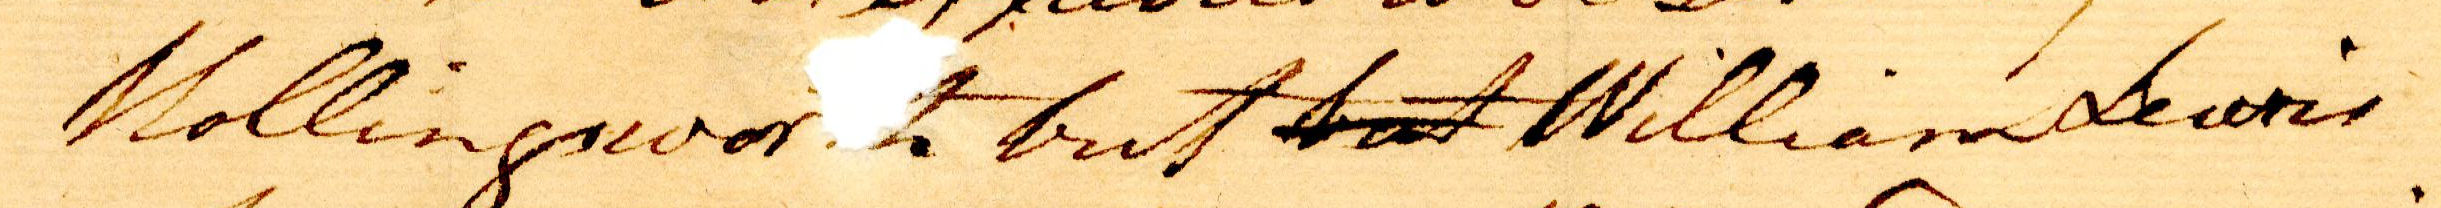Hollingsworth but [but] William Lewis
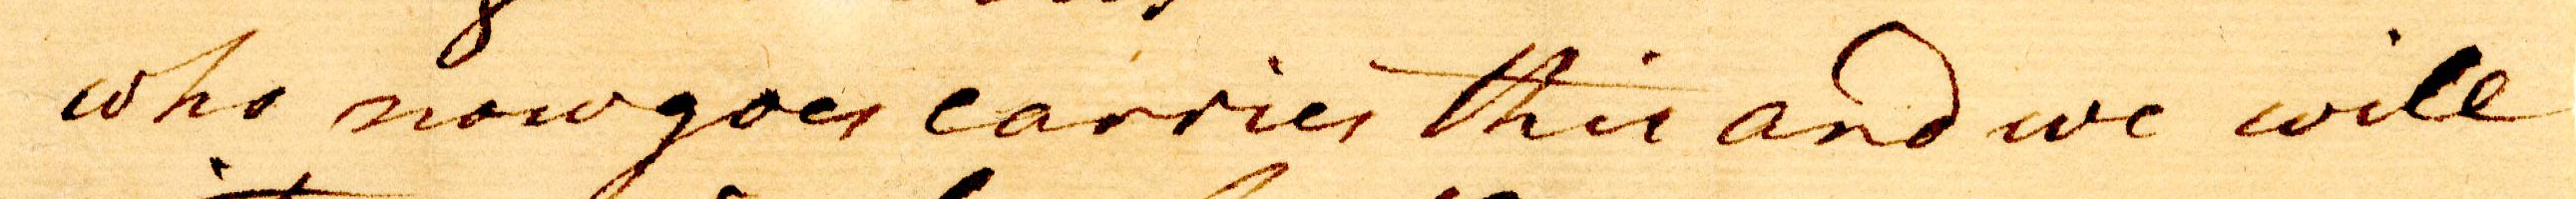who now goes carries this and we will
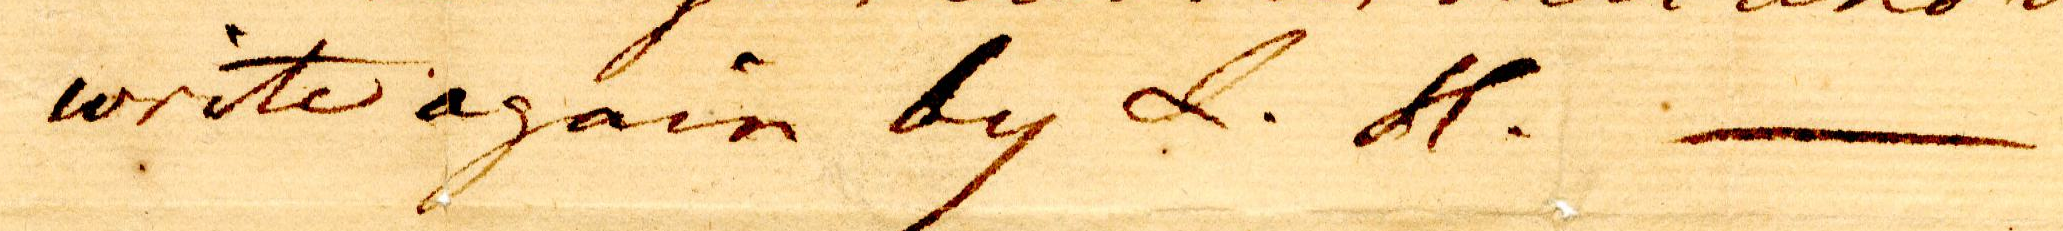write again by L.H.-
